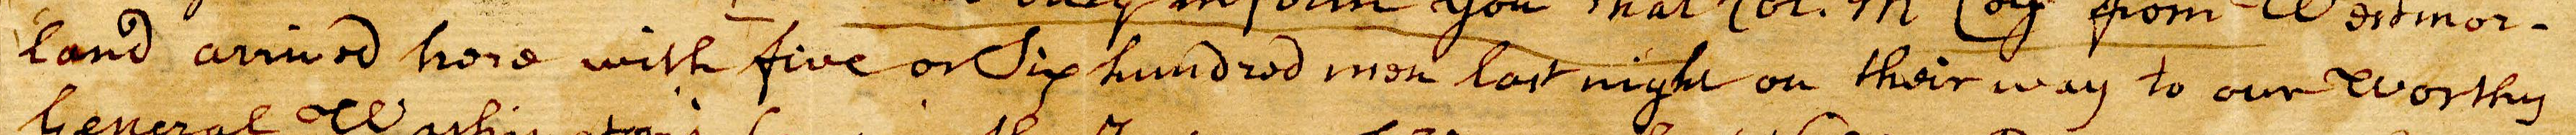land arrived here with five or six hundred men last night on their way to our Worthy
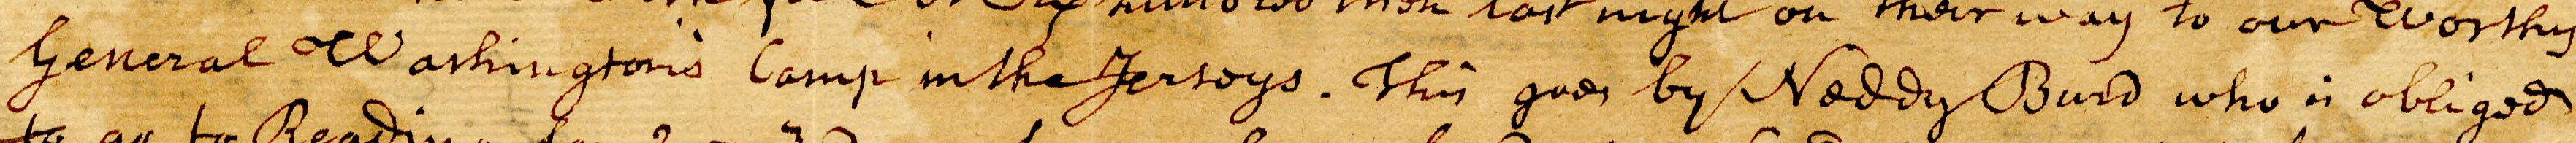General Washington's Camp in the Jerseys. This goes by Neddy Burd who is obliged
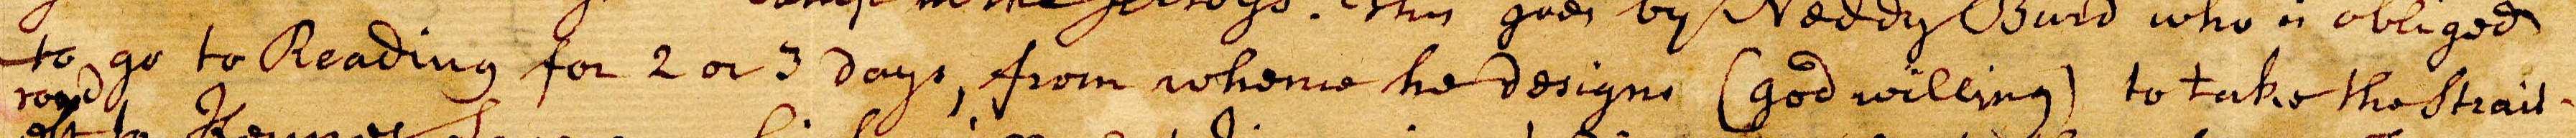to go to Reading for 2 or 3 days, from where he designs (god willing) to take the strait
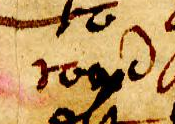road
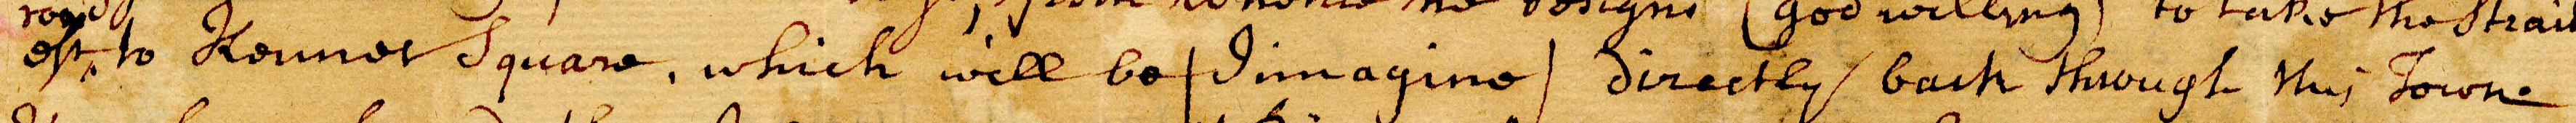off ^ to Kennet Square, which will be (Imagine) directly back through this Town
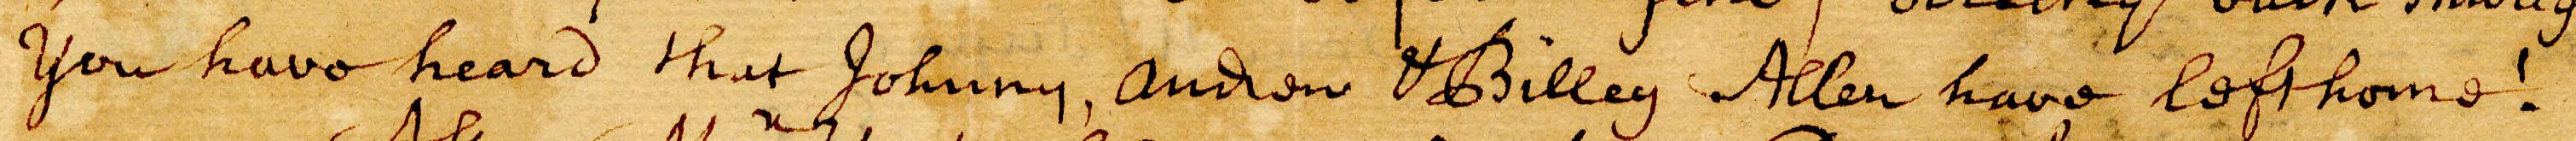You have heard that Johnny, Andrew & Billy Allen have left home!
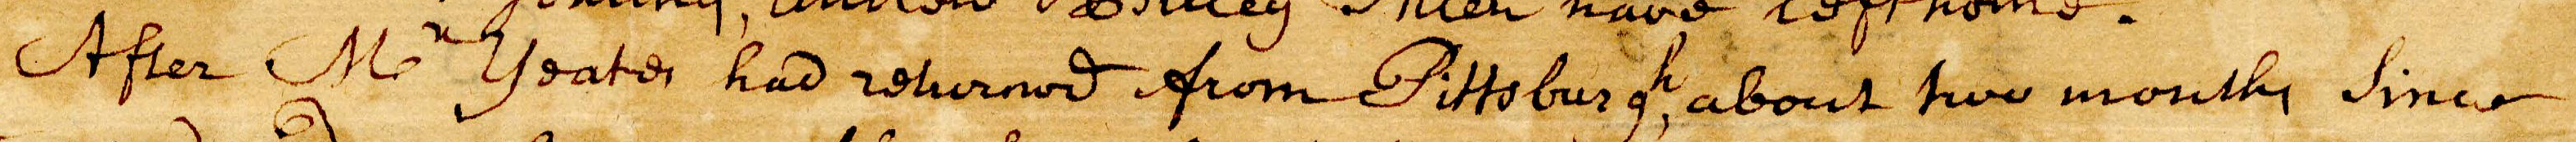After M^r Yeates had returned from Pittsburg^h, about two months since
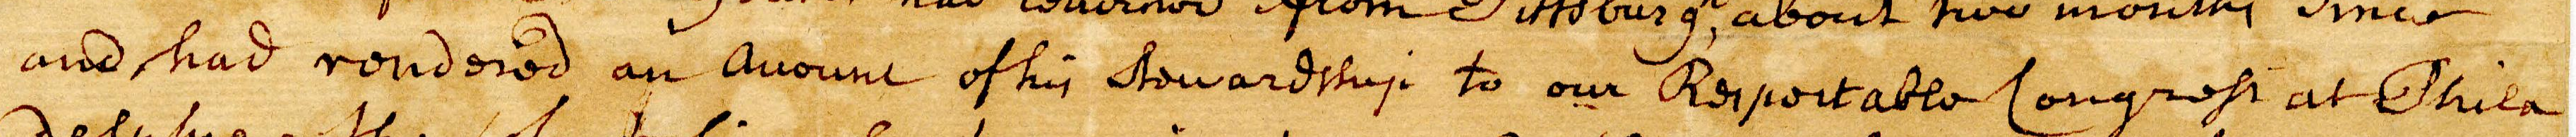and had rounded an Account of his stewardship to our Respectable Congress at Phila
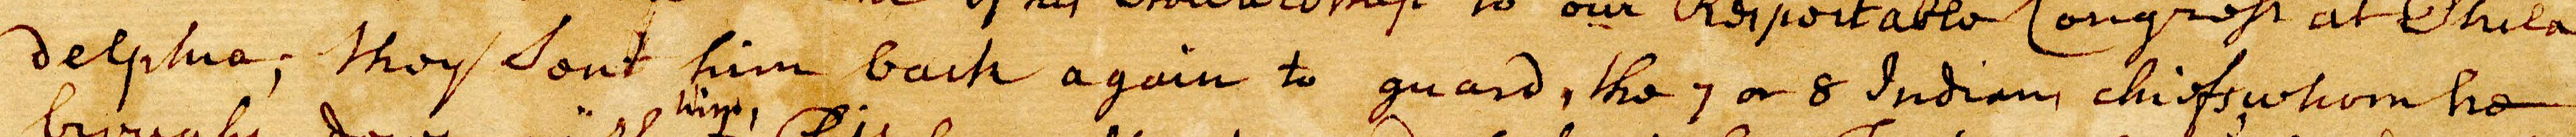delphia,- they sent him back again to guard, the 7 or 8 Indian chiefs, whom he
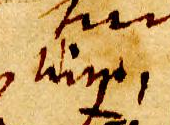him
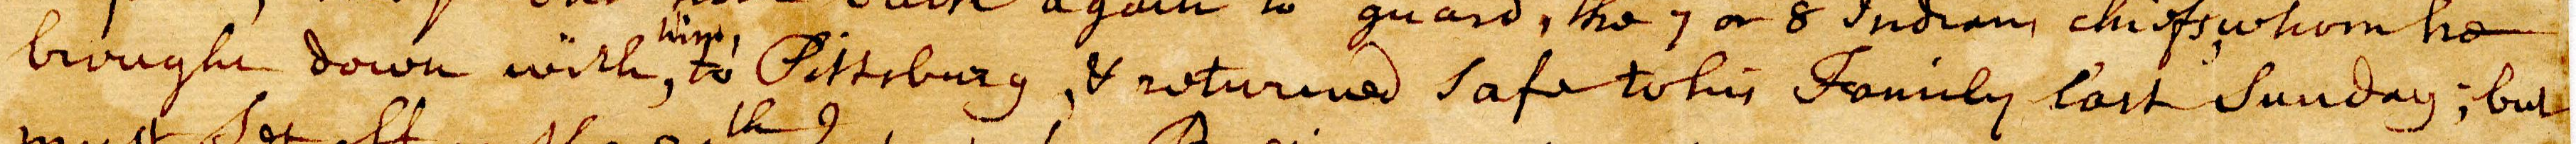brought down with, to Pittsburg, & returned safe to his Family last Sunday; but
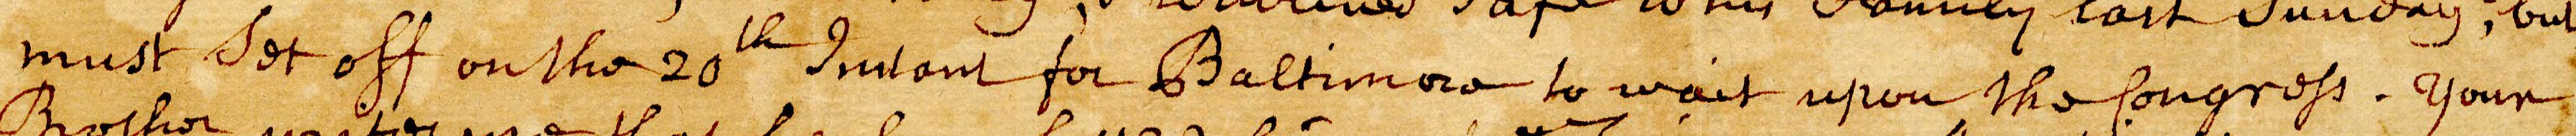must set off on the 20^th Instant for Baltimore to wait upon the Congress. Your
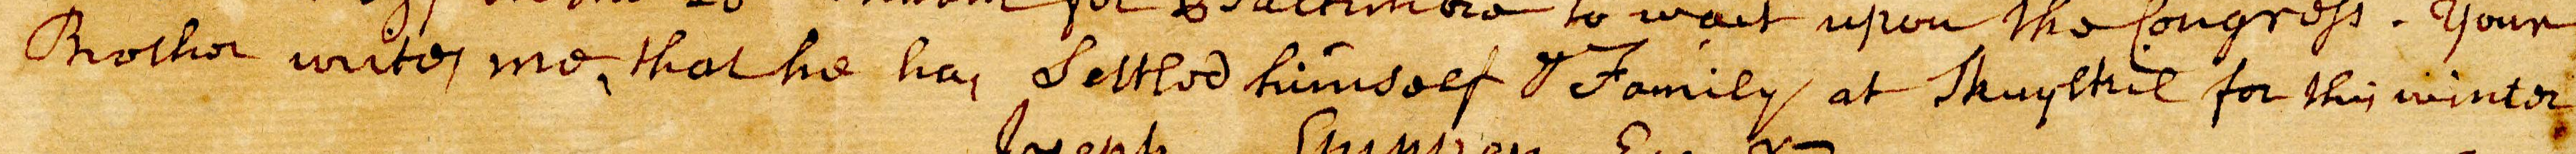Brother writes me, that he has settled himself & Family at Skuylkil for this winter
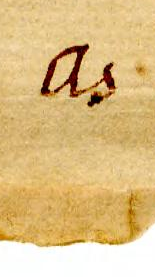As
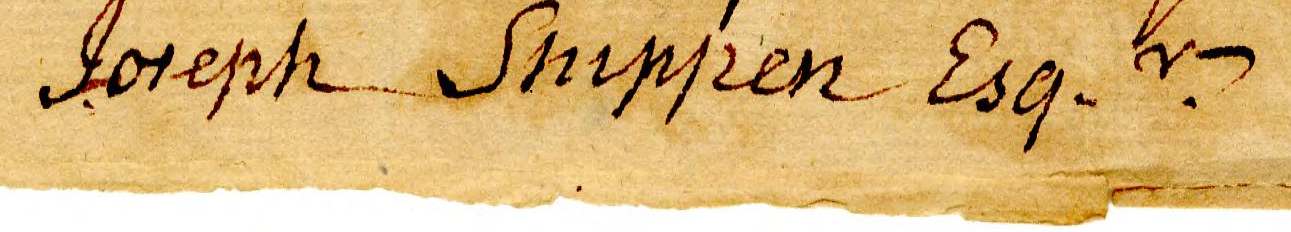Joseph Shippen Esq.^r.
